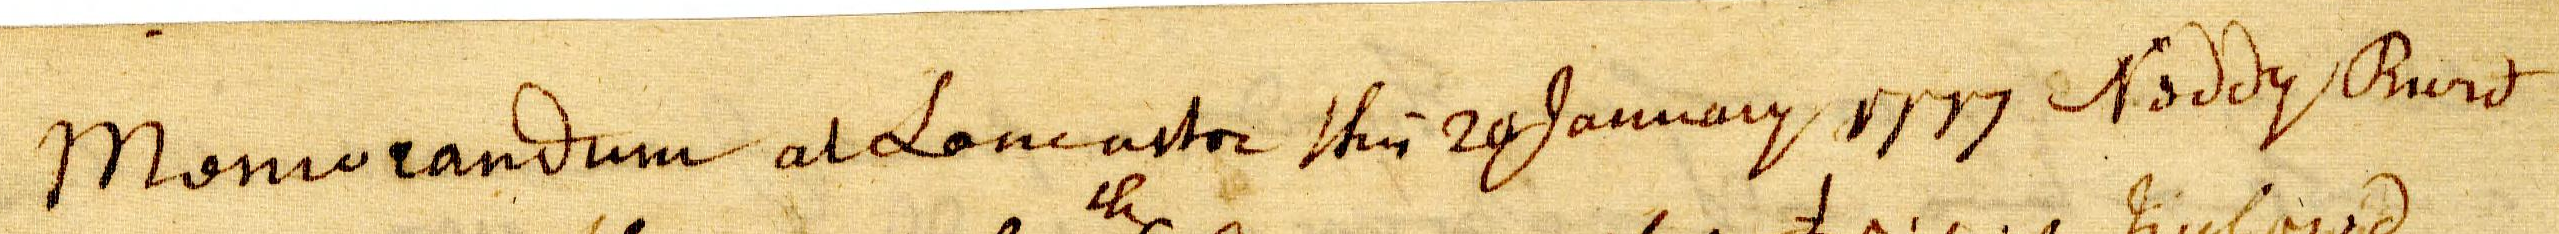Memorandum at Lancaster this 20 January 1777 Neddy Burd
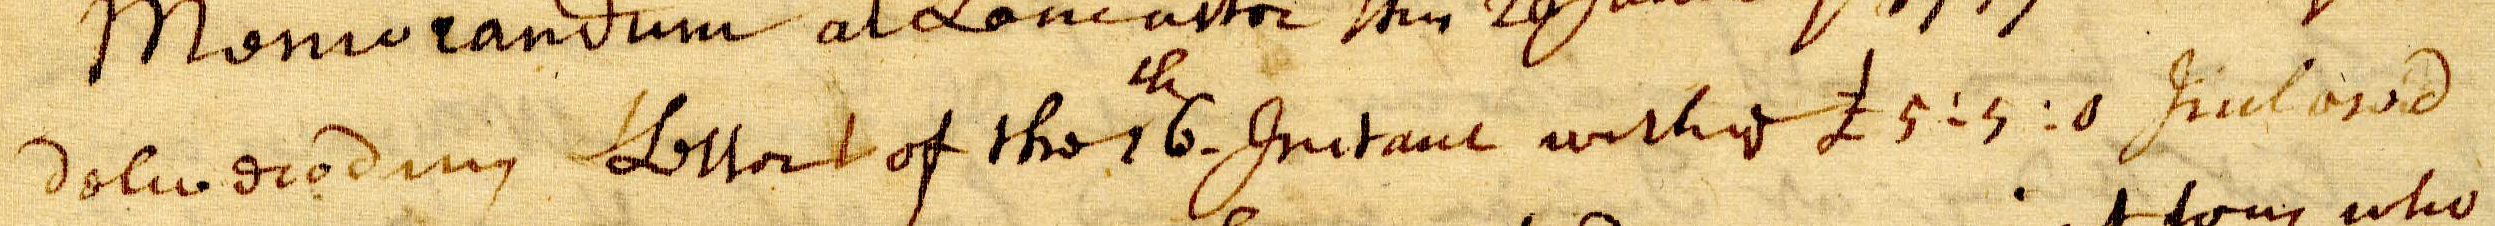delivered my Letter of the 16. Instant with y^e £5..5..0 Inclosed
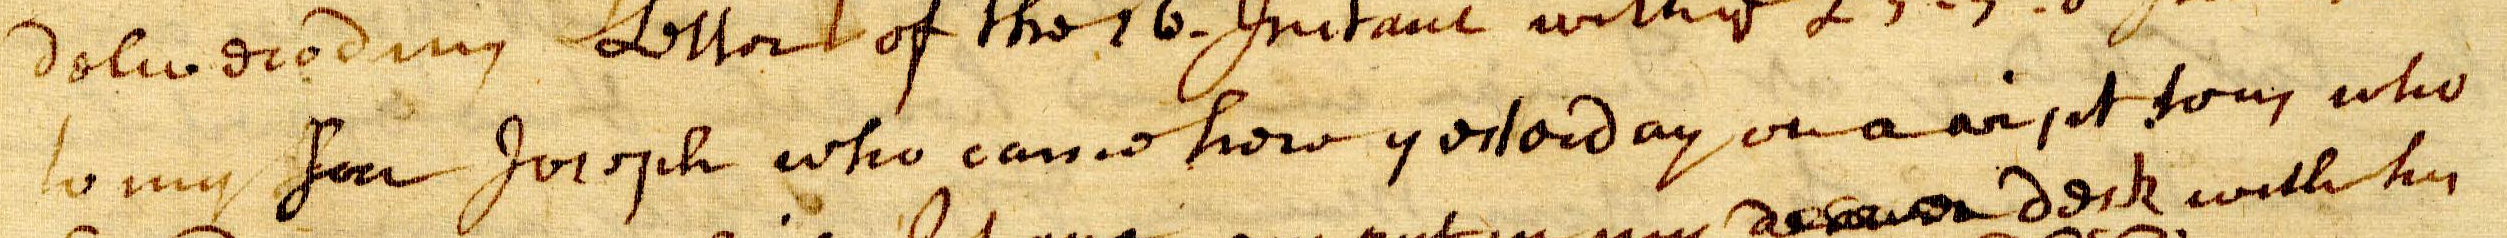to my Son Joseph who came here yesterday on a visit to us who
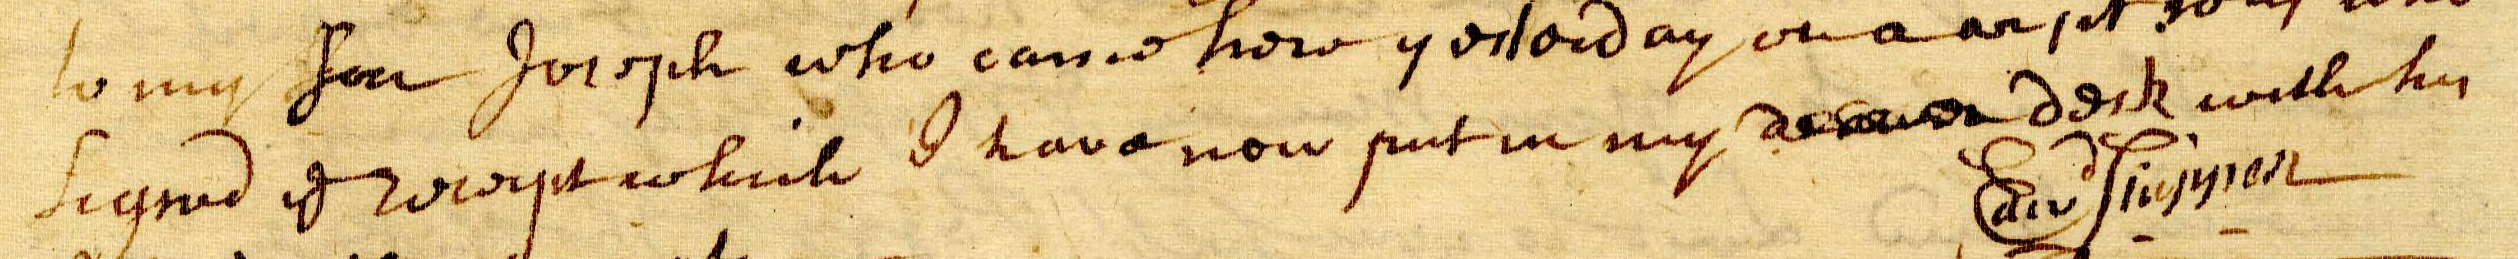signed y^e receipt which I have now put in my [_____] desk with his
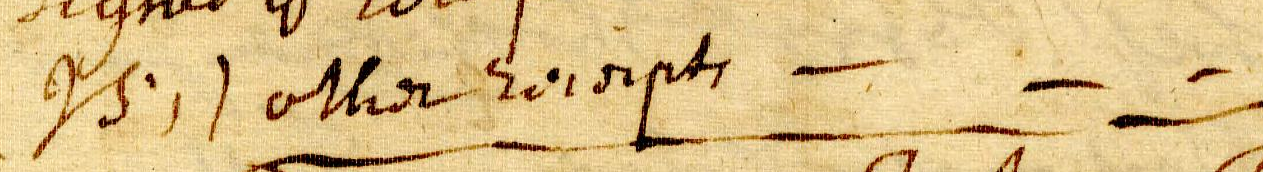(JS;) other receipts - - -
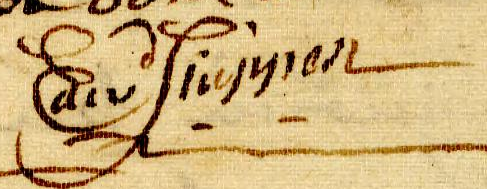Edw^d Shippen
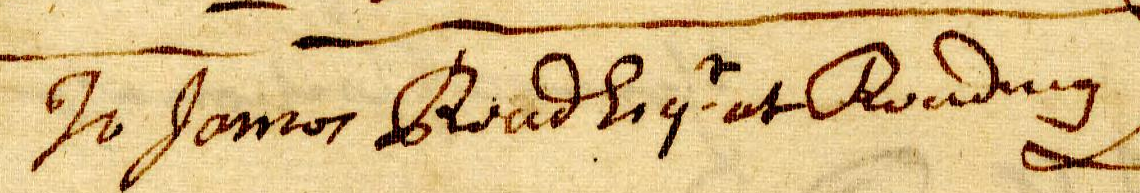To James Read Esq^r. at Reading
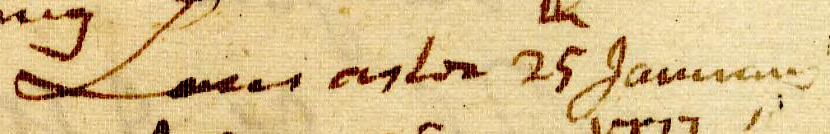Lancaster 25 January
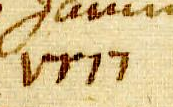1777
